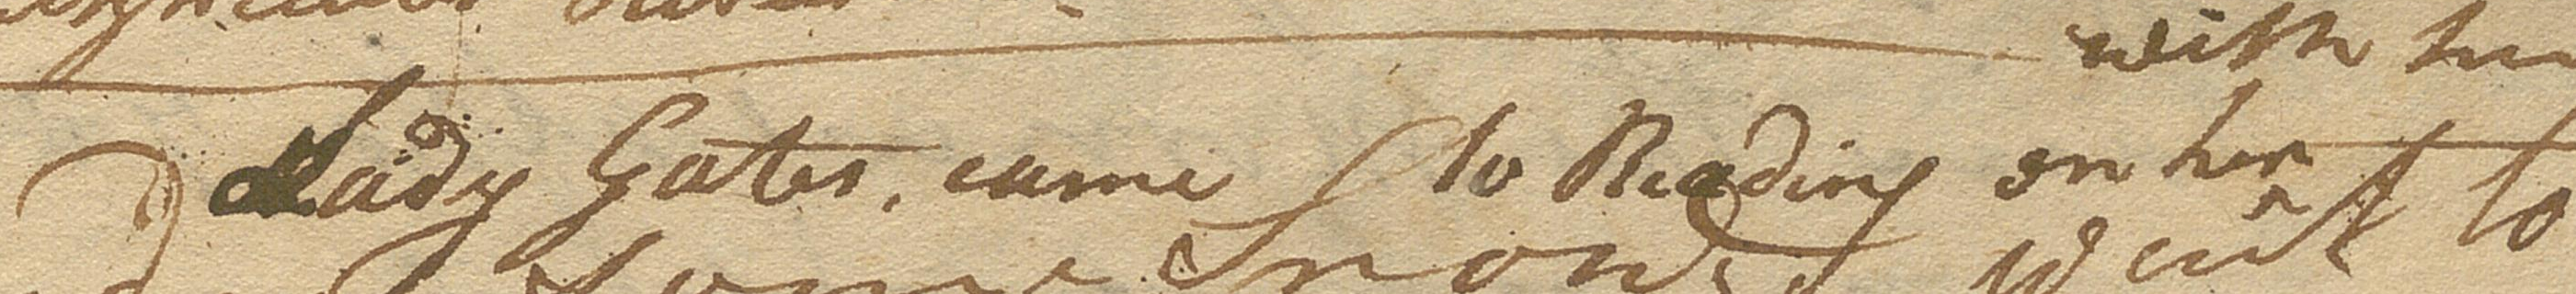Lady Gates, came to Reading on her
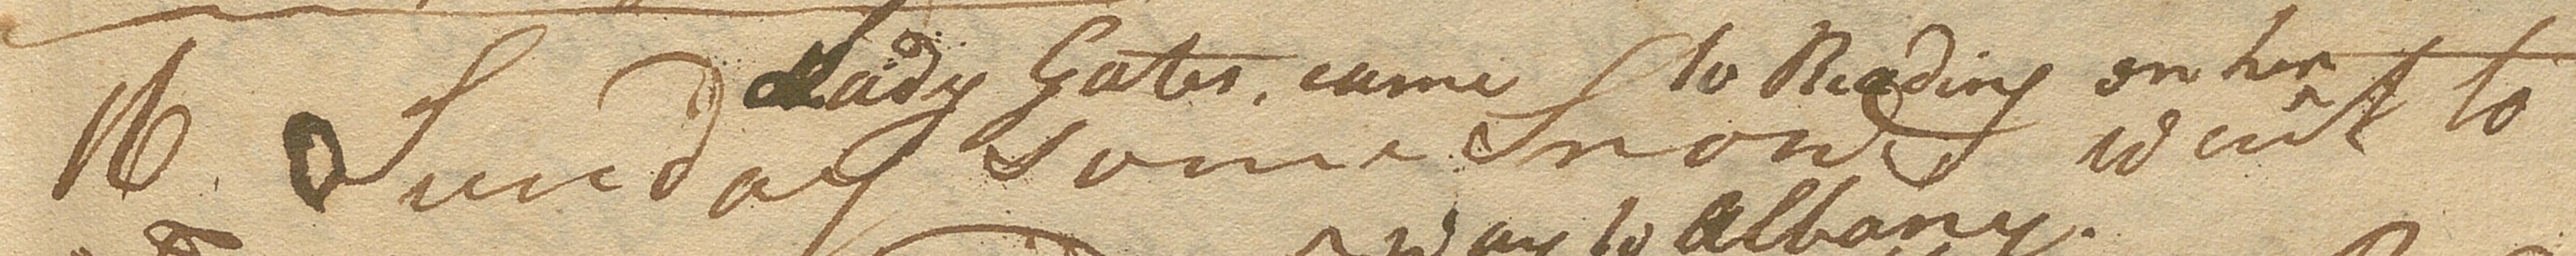16 Sunday some Snow went to
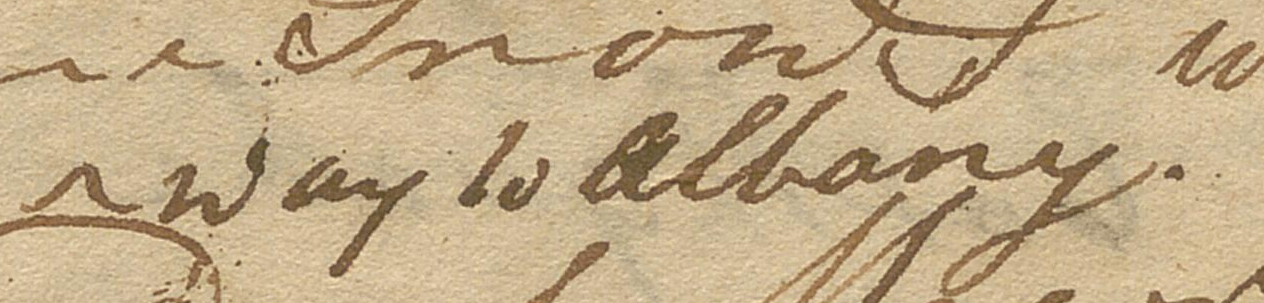way to Albany.
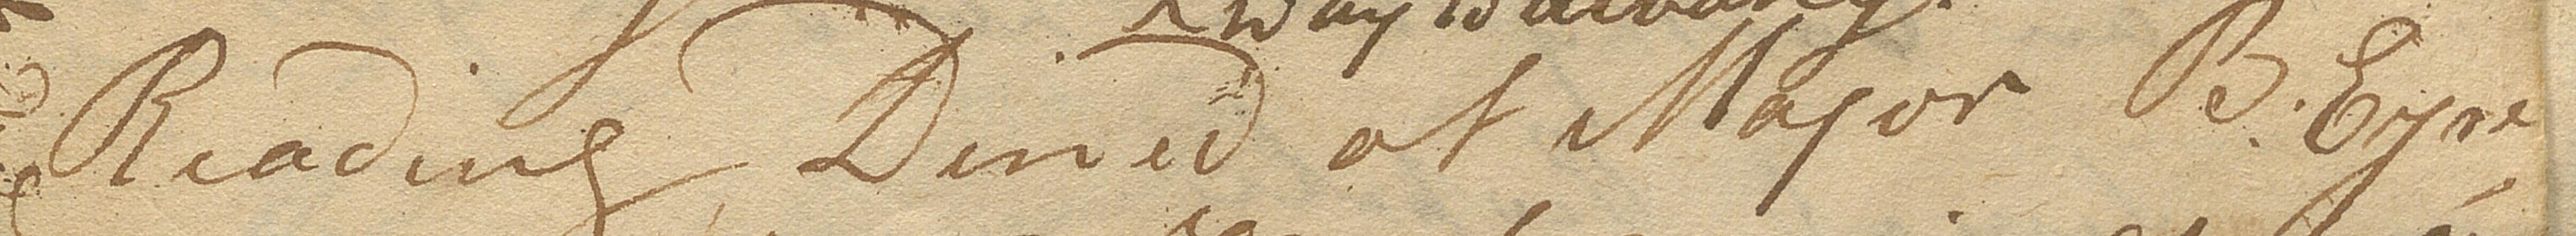Reading Dined at Major B. Eyre
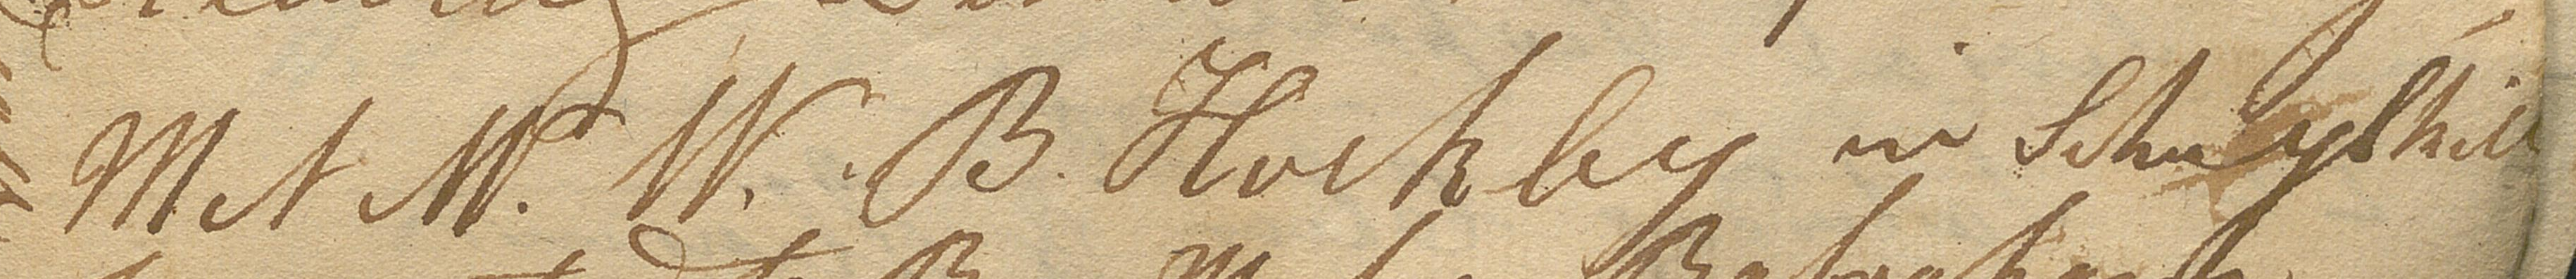Met M^r. W. B Hockley in Schuylhill
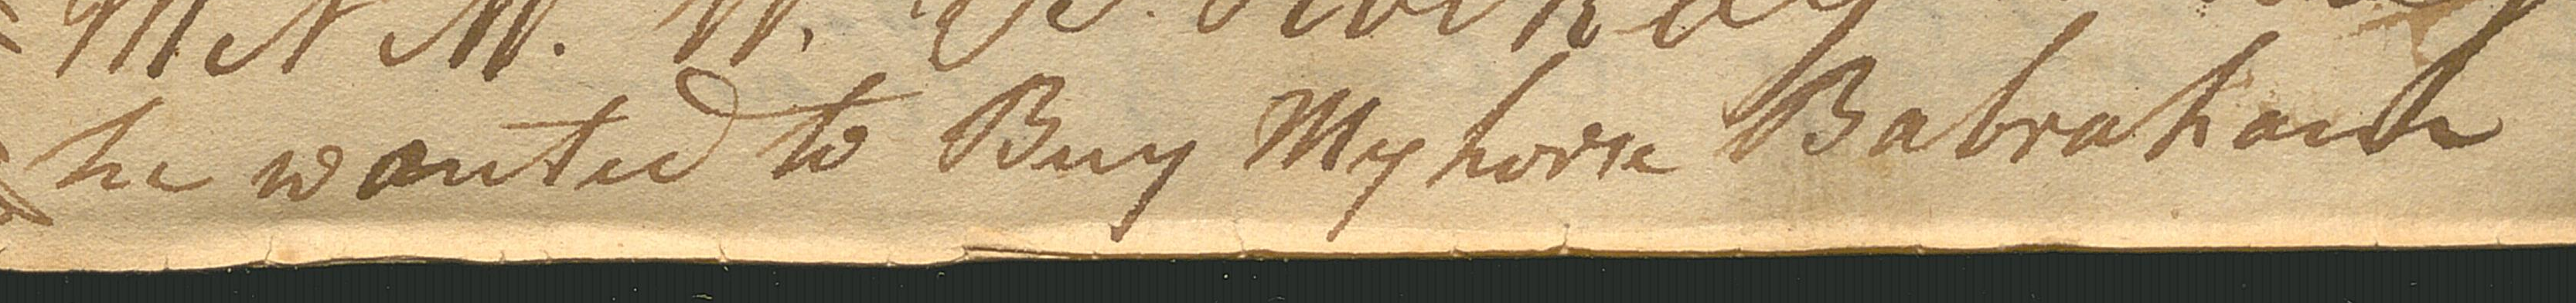he wanted to Buy My horse Babraham
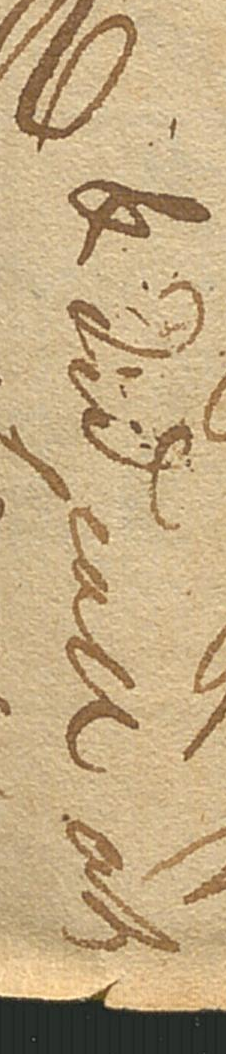& did call at
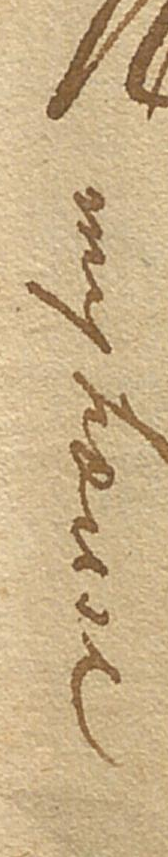my house
